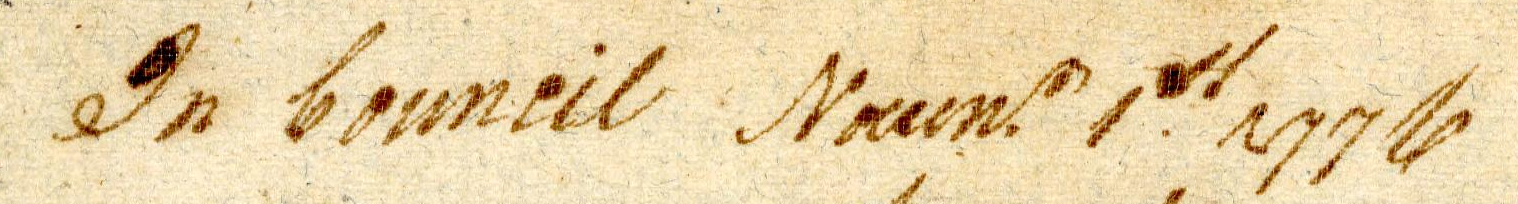In Council Novem^r. 1^st. 1776
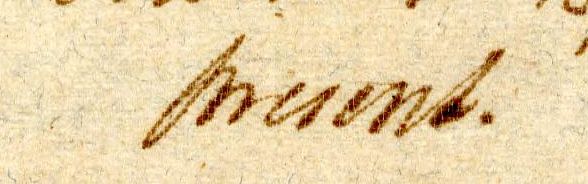present.
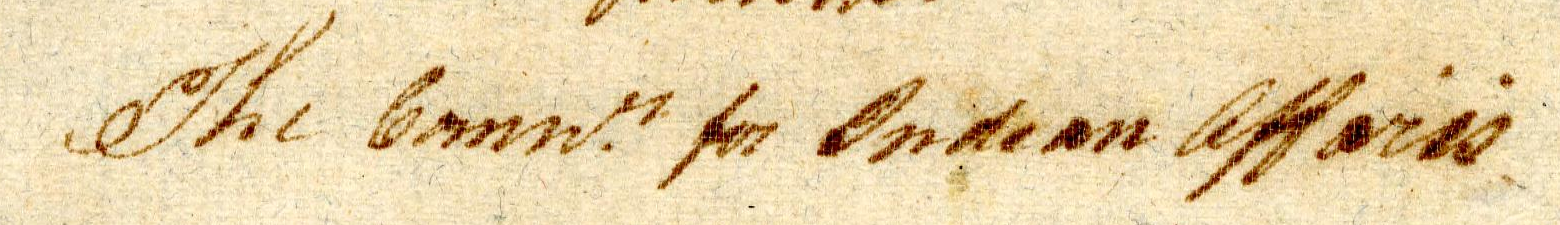The Comn^r. for Indian Affaris
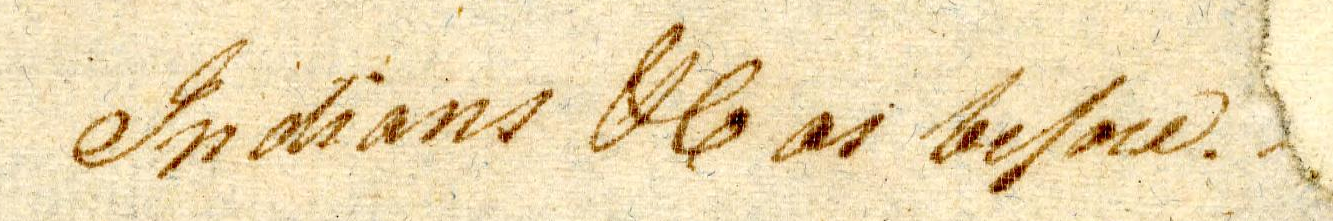Indians &c as before.
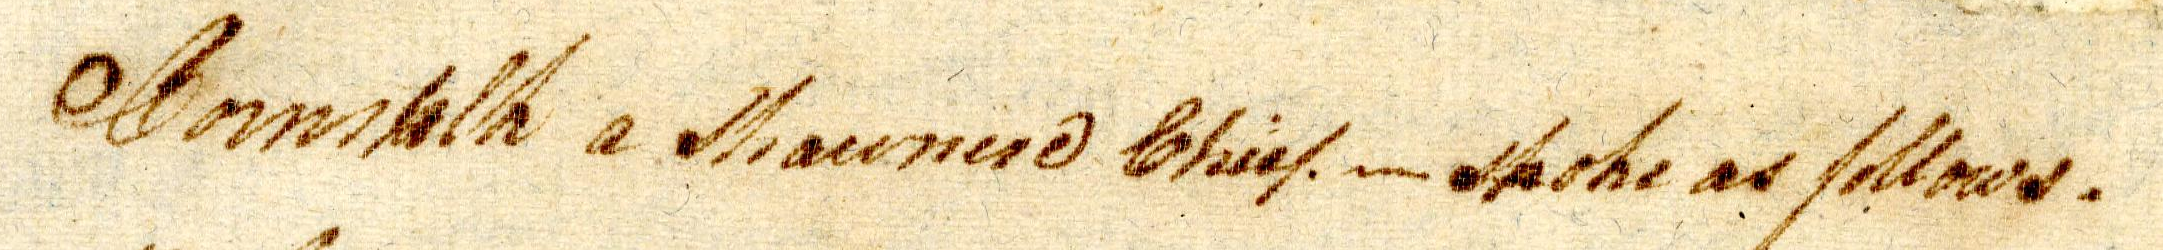Cornstalk a Shawnese Chief.- spoke as follows.
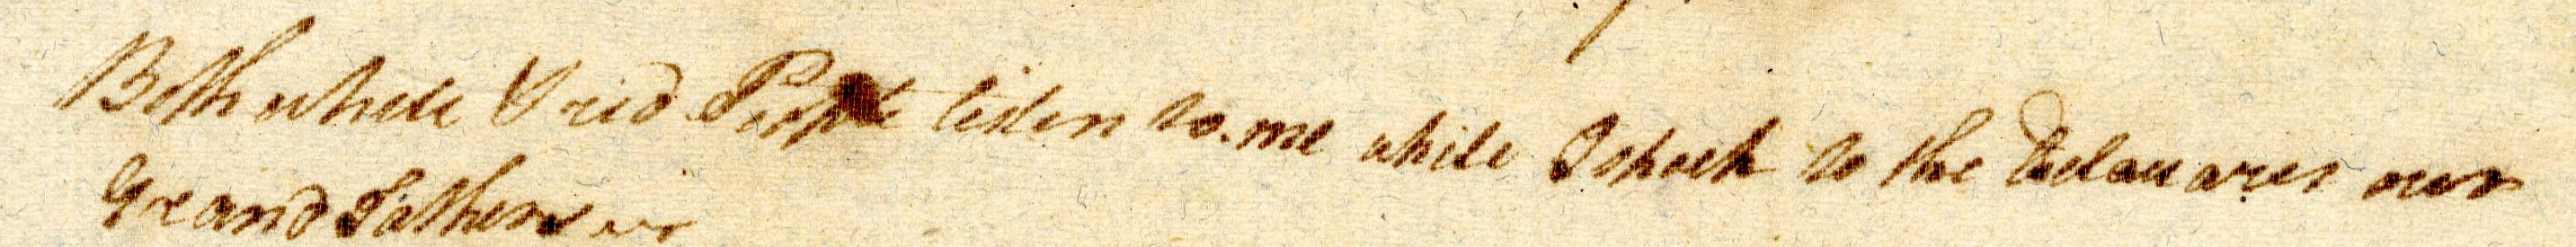Both white & red People listen to me while I speak to the Delawares our
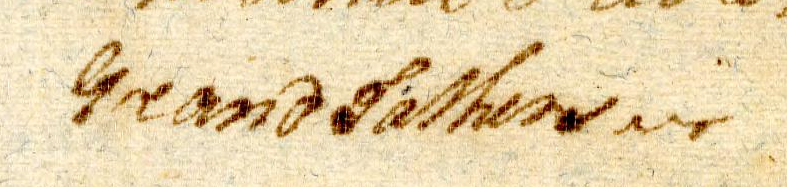Grand Fathers-
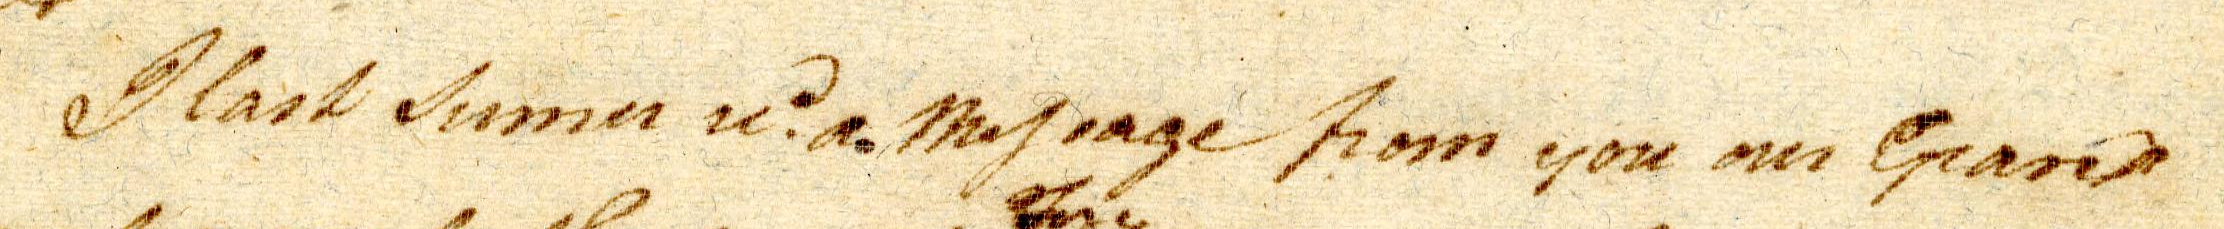I last Sumer re^d. a Message from you our Grand
